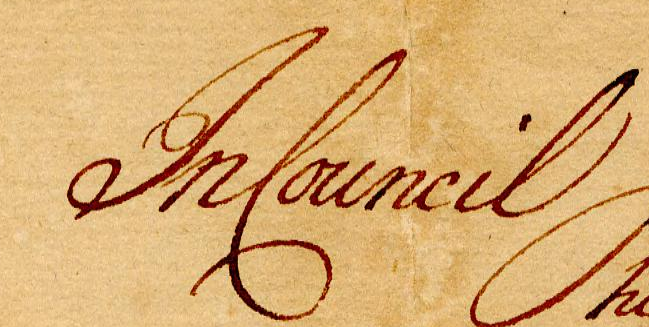In Council
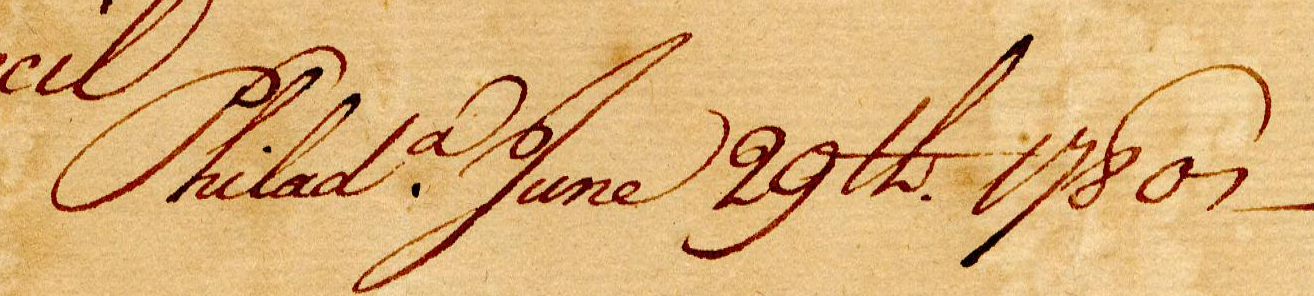Philad^a. June 29th. 1780
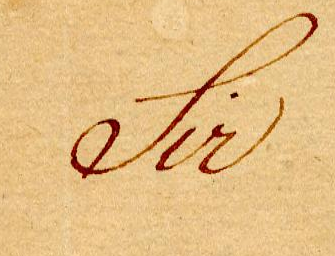Sir
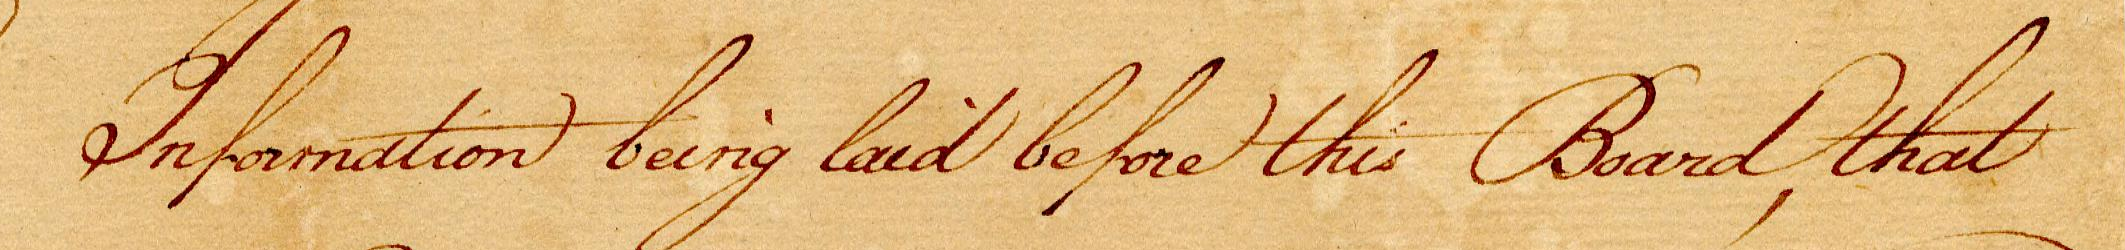Information being laid before this Board, that
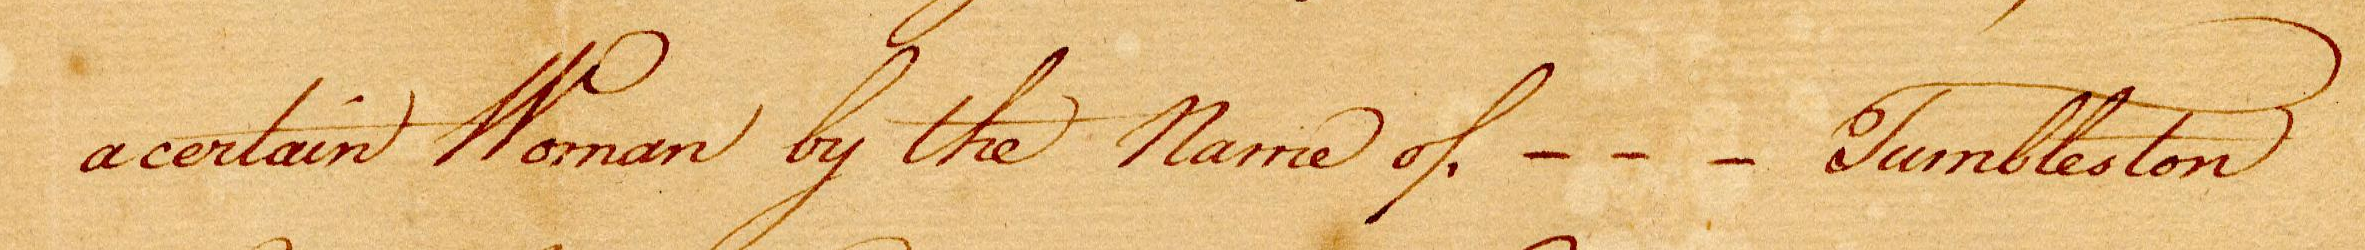a certain Woman by the Name of. --- Tumbleston
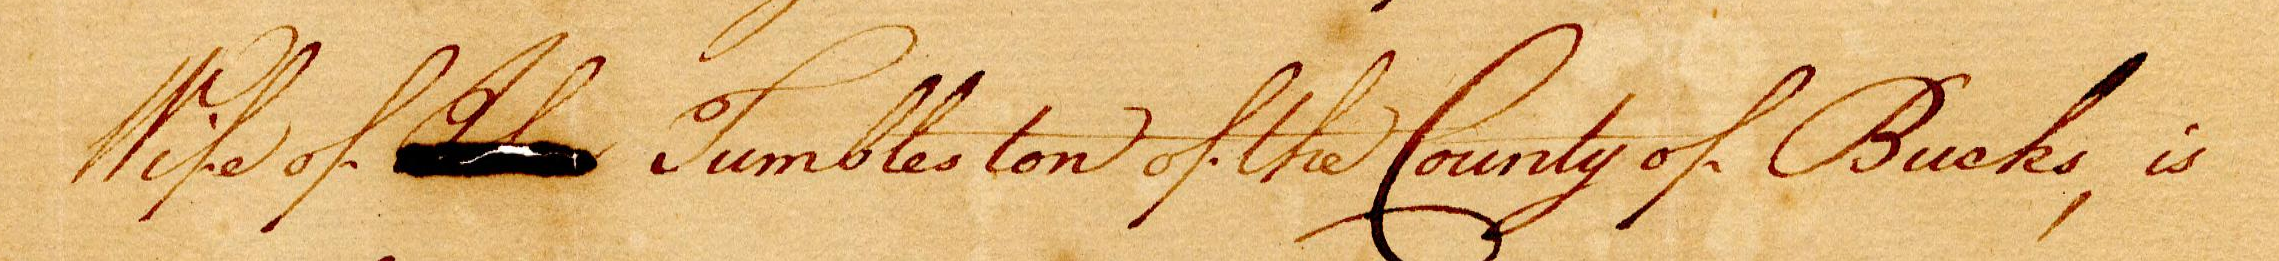Wife of [___] Tumbleston of the County of Bucks, is
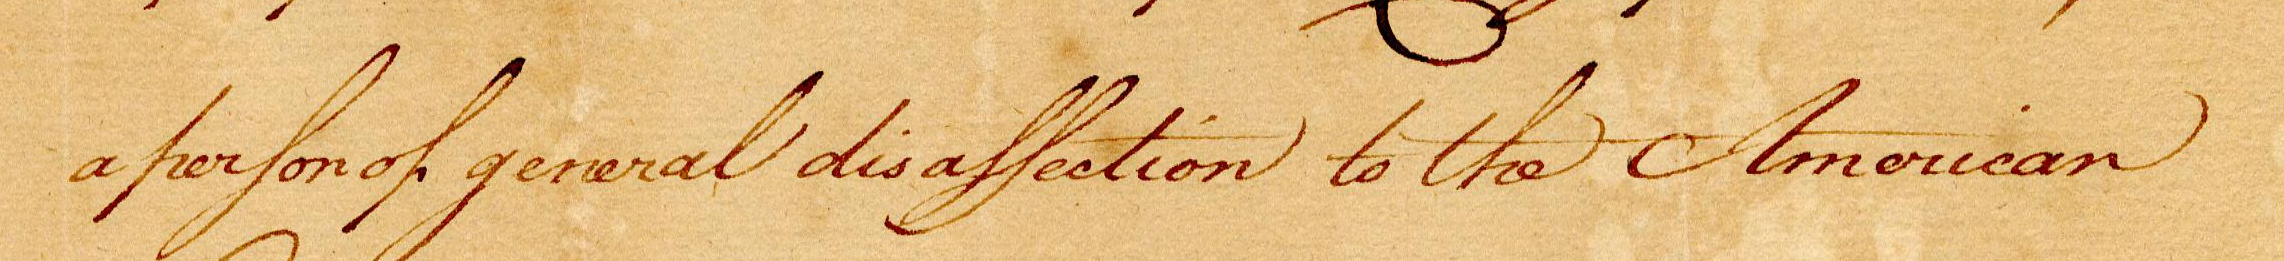a person of general disaffection to the American
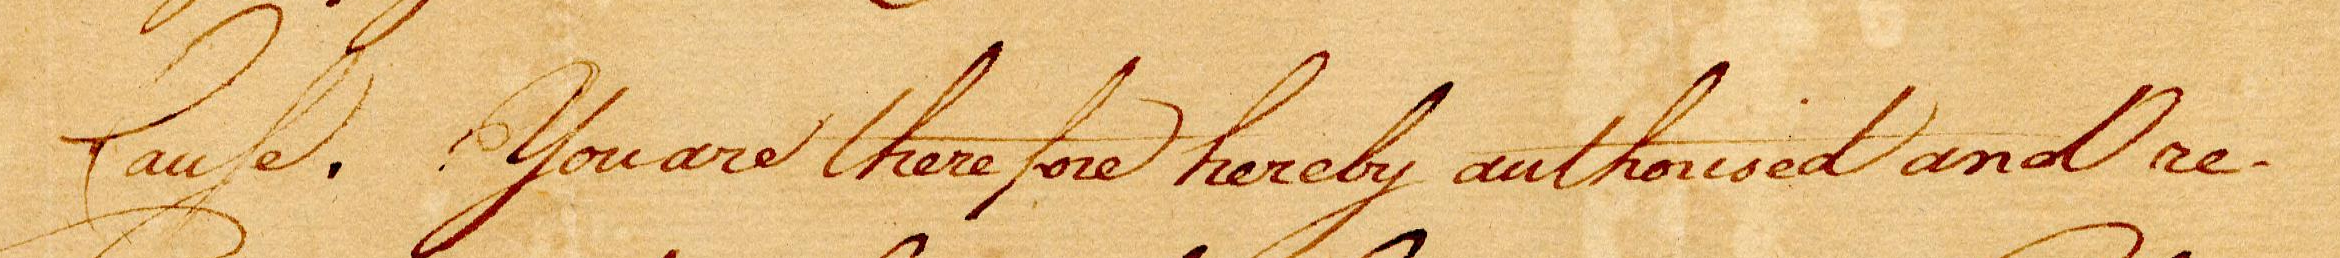Cause. You are therefore hereby authorised and re-
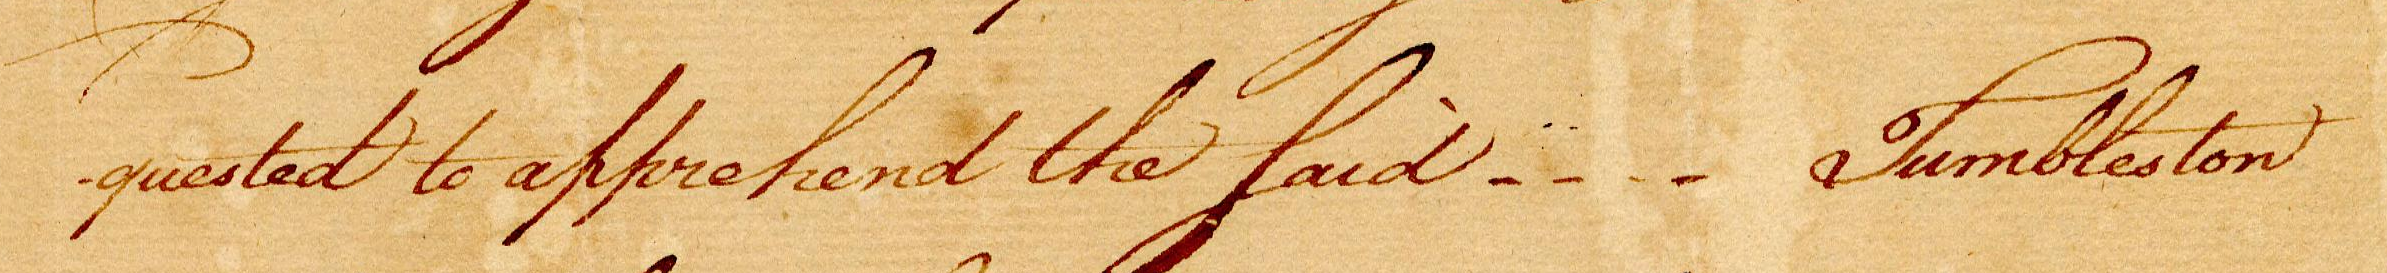-quested to apprehend the said --- Tumbleston
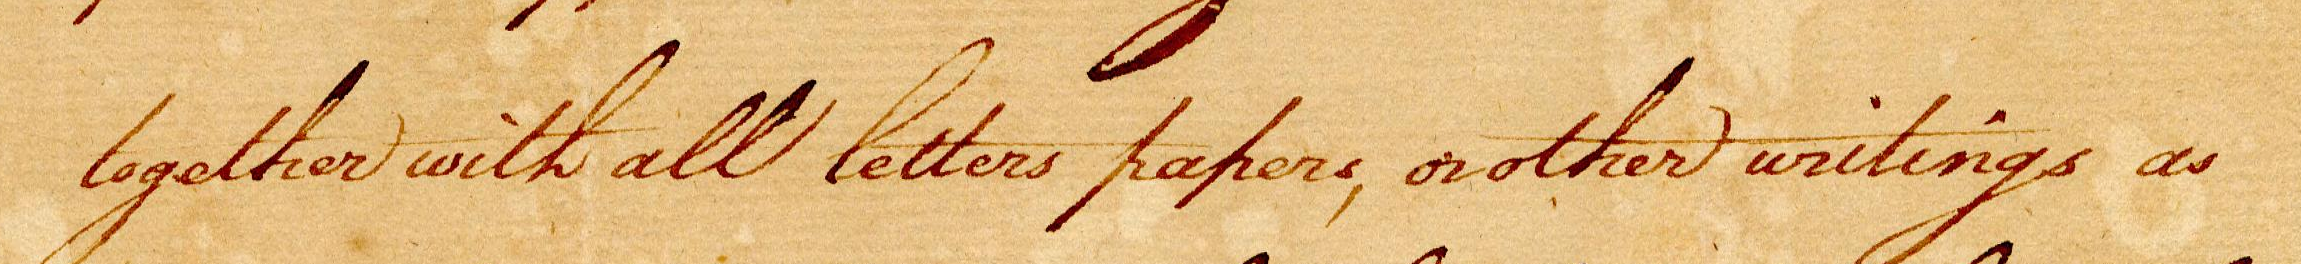together with all letters papers, or other writings as
